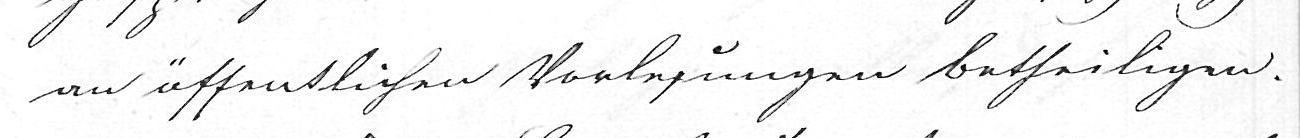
an öffentlichen Vorlesungen betheiligen.
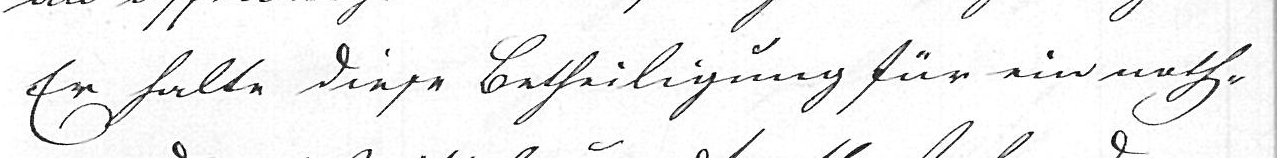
Er halte diese Betheiligung für ein noth-
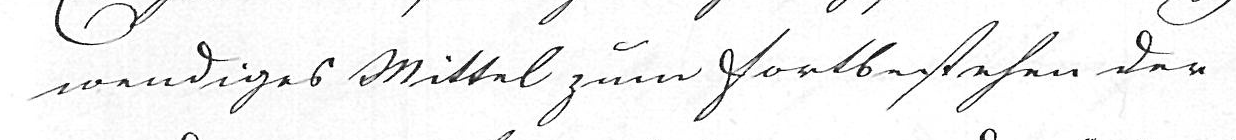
wendiges Mittel zur Fortbestehen der
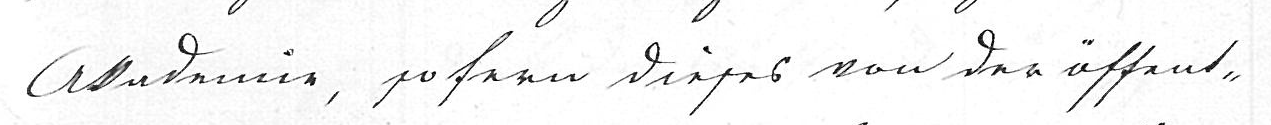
Akademie, sofern dieses von der öffent-
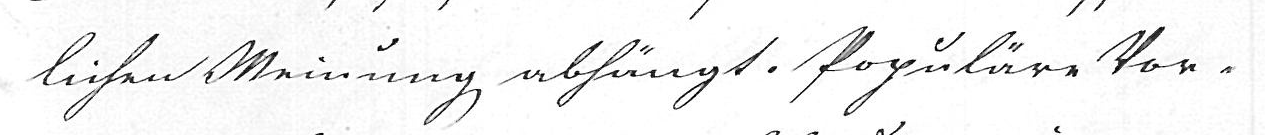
lichen Meinung abhängt. Populäre Vor-
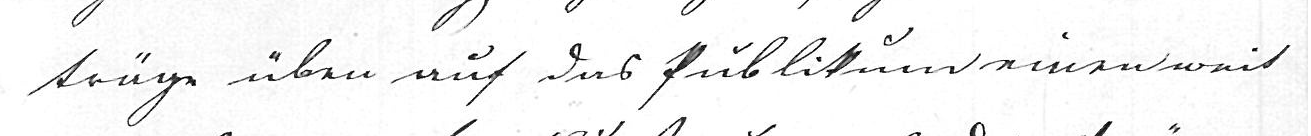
träge üben auf das Publikum einen weit
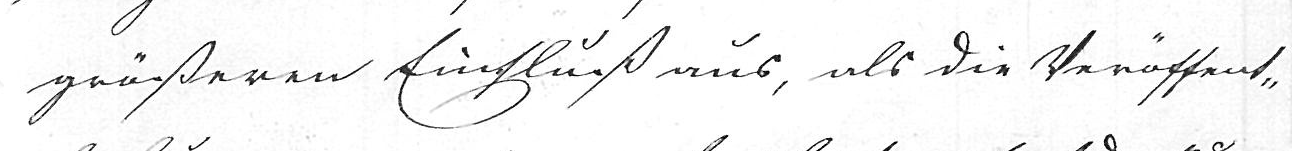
größeren Einfluß aus, als die Veröffent-
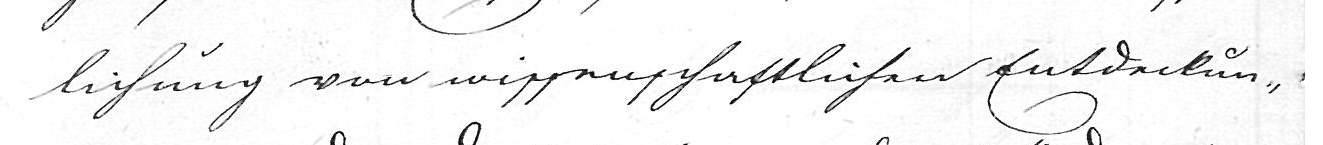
lichung von wissenschaftlichen Entdeckun-
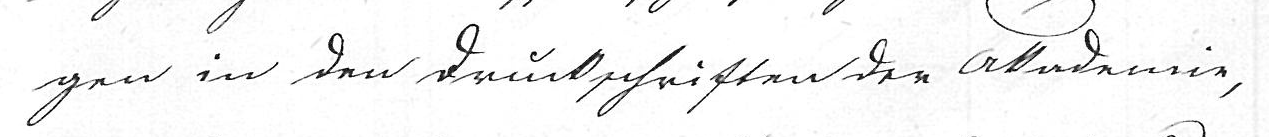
gen in den Druckschriften der Akademie,
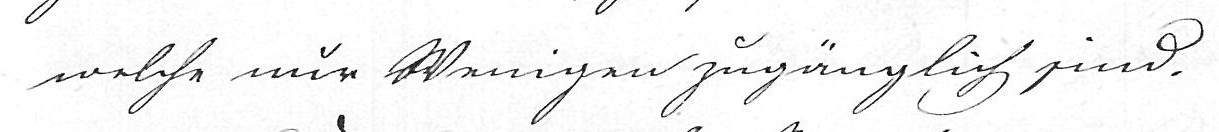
welche nur Wenigen zugänglich sind.
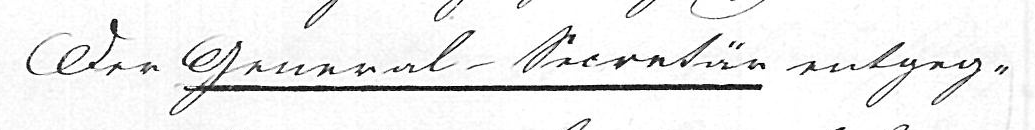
Der General-Secretär entgeg-
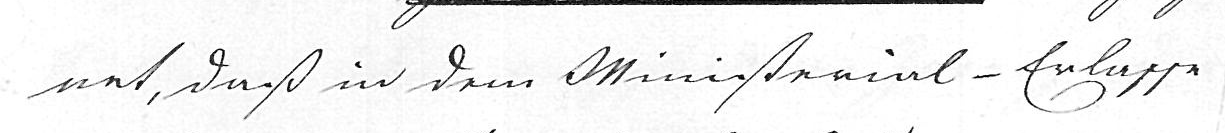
net, daß in dem Ministerial-Erlasse
